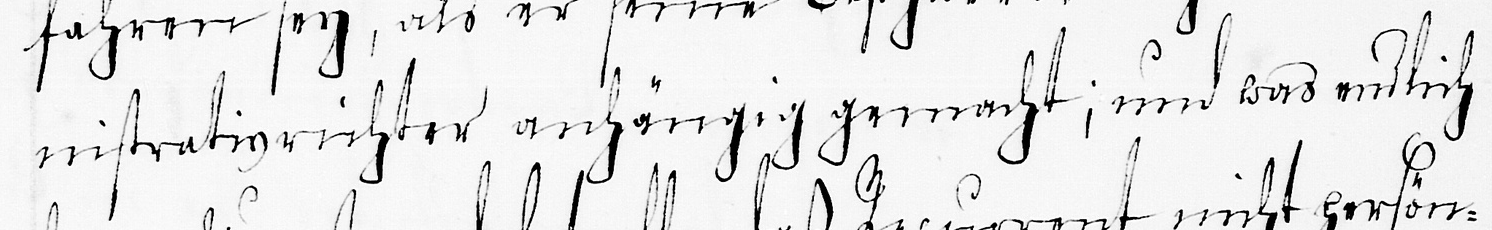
nistrativrichter anhängig gemacht, und was endlich
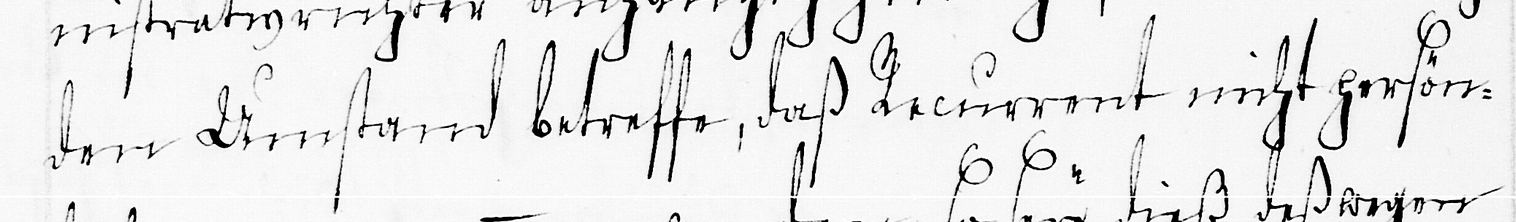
den Umstand betreffe, daß Recurrent nicht persön¬
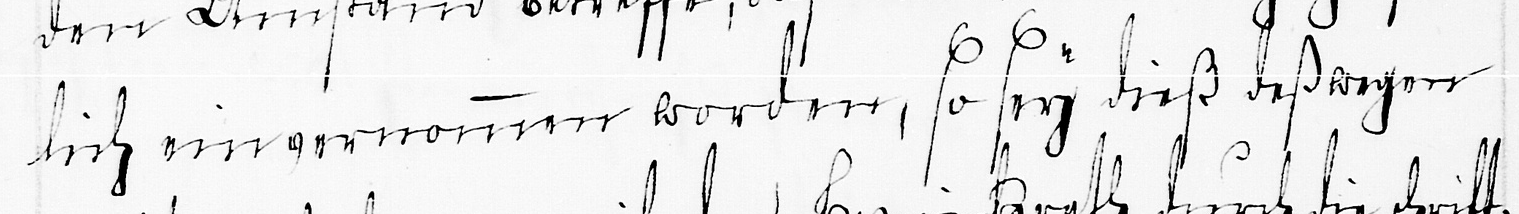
lich einvernommen worden, so sey dieß deßwegen
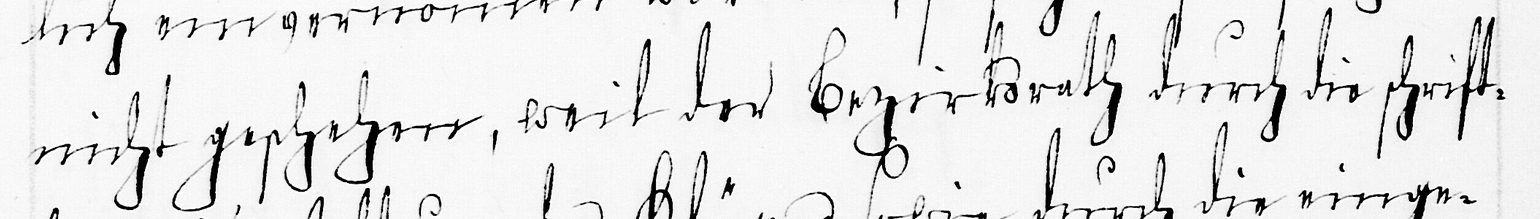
nicht geschehen, weil der Bezirksrath durch die schrift¬
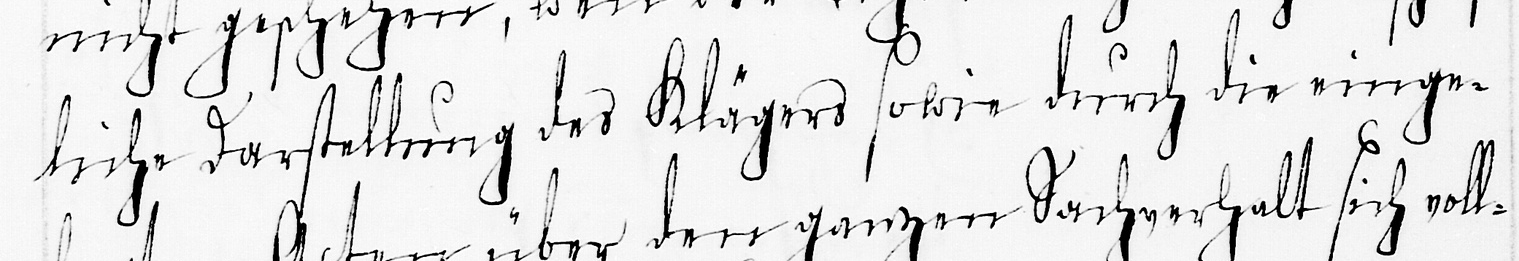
liche Darstellung des Klägers sowie durch die einge¬
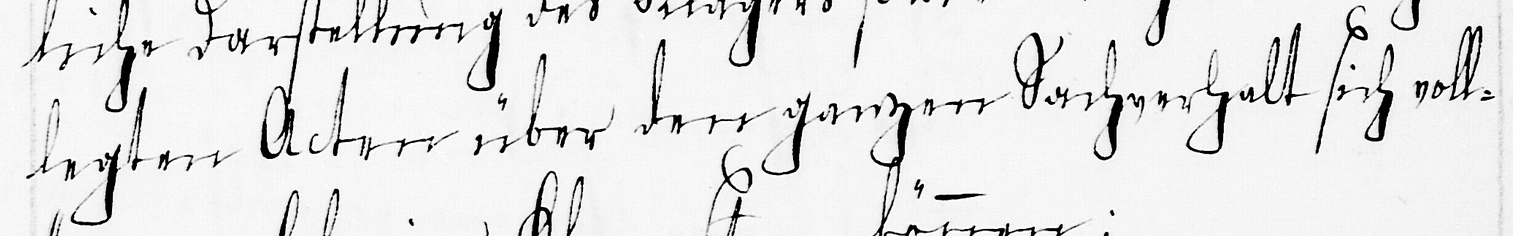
legten Acten über den ganzen Sachverhalt sich vol¬
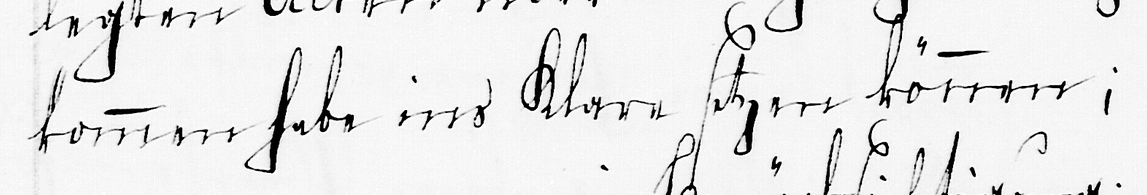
lkommen habe ins Klare setzen können;
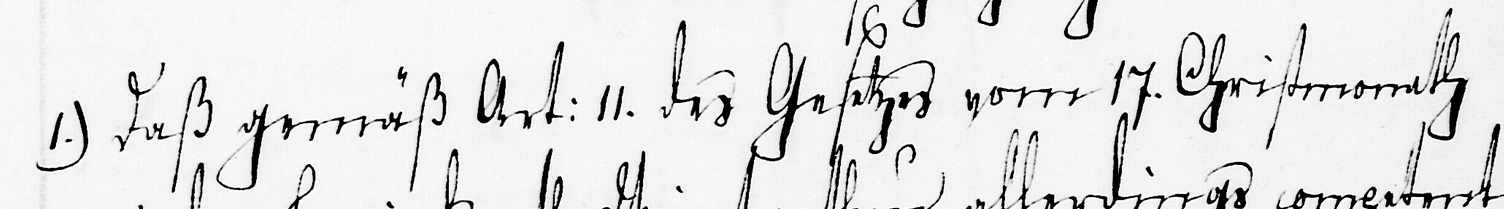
1.) Daß gemäß Art: 11. des Gesetzes vom 17. Christmonath
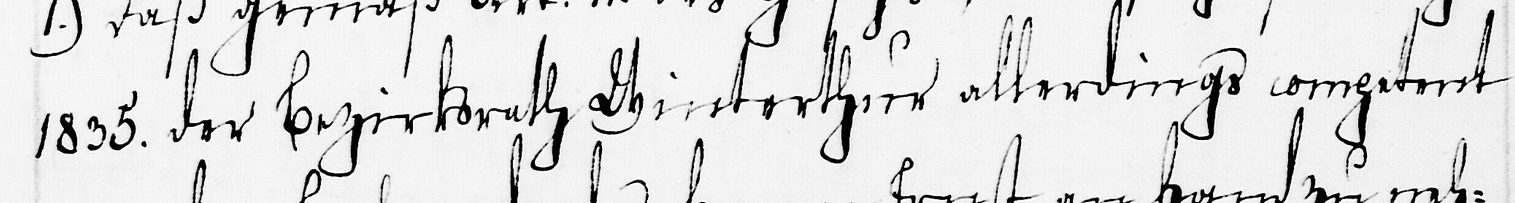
1835. der Bezirksrath Winterthur allerdings competent
